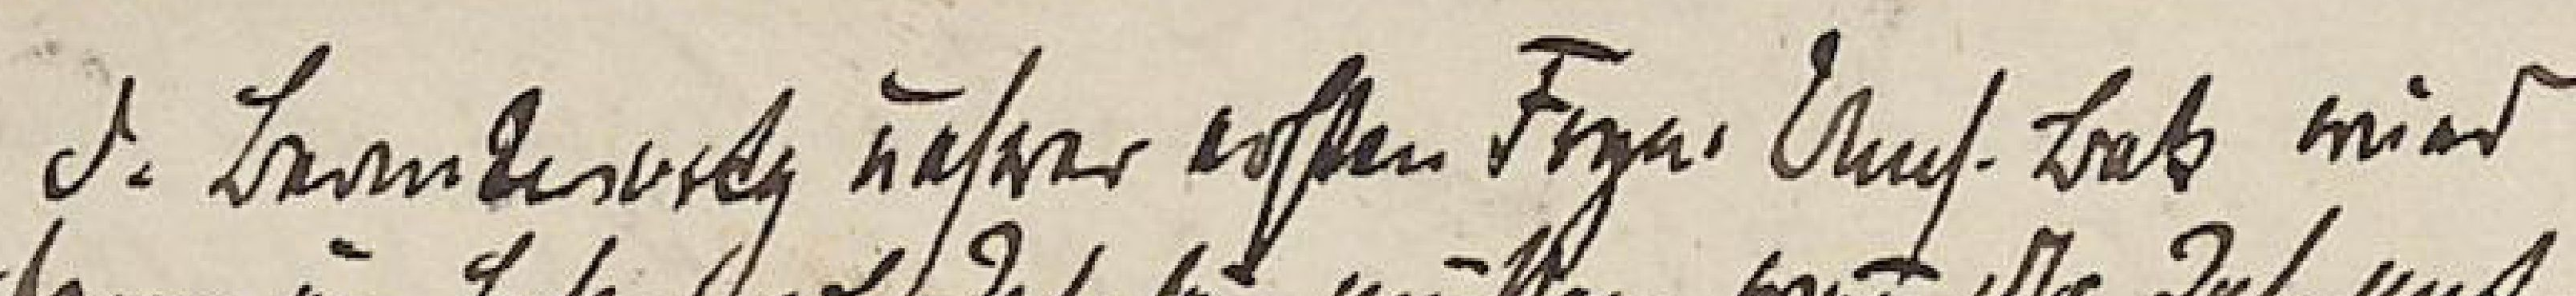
d. Beantwortg. unsrer ersten Frage: Uns. Bek. wird
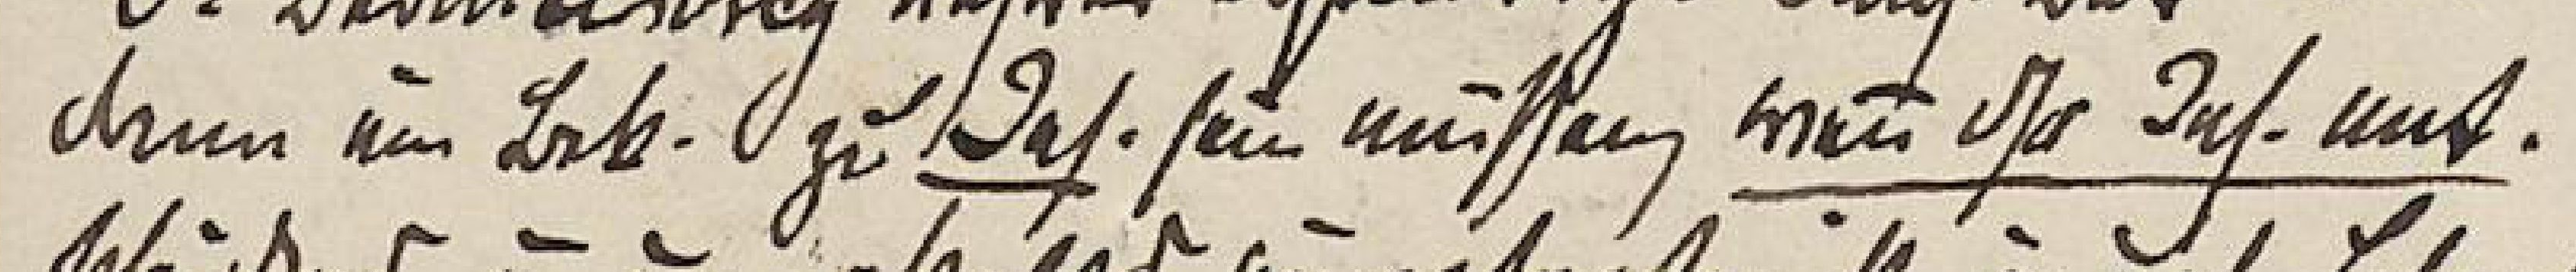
dann ein Bek. zu Jes. sein müssen, wenn dsr Jes. ent¬
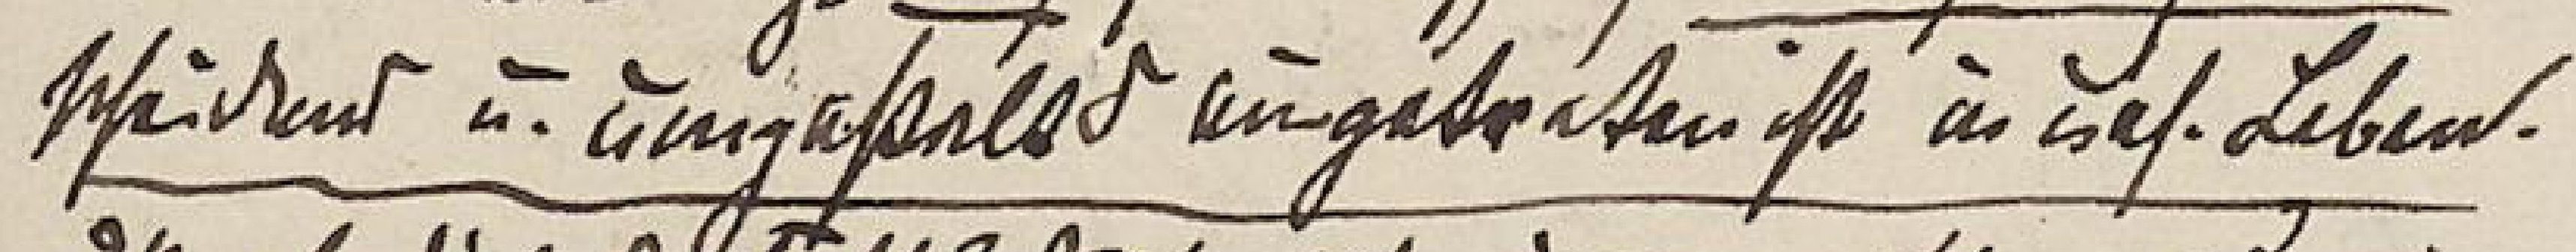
scheidend un umgestaltd. eingetreten ist in uns. Leben.
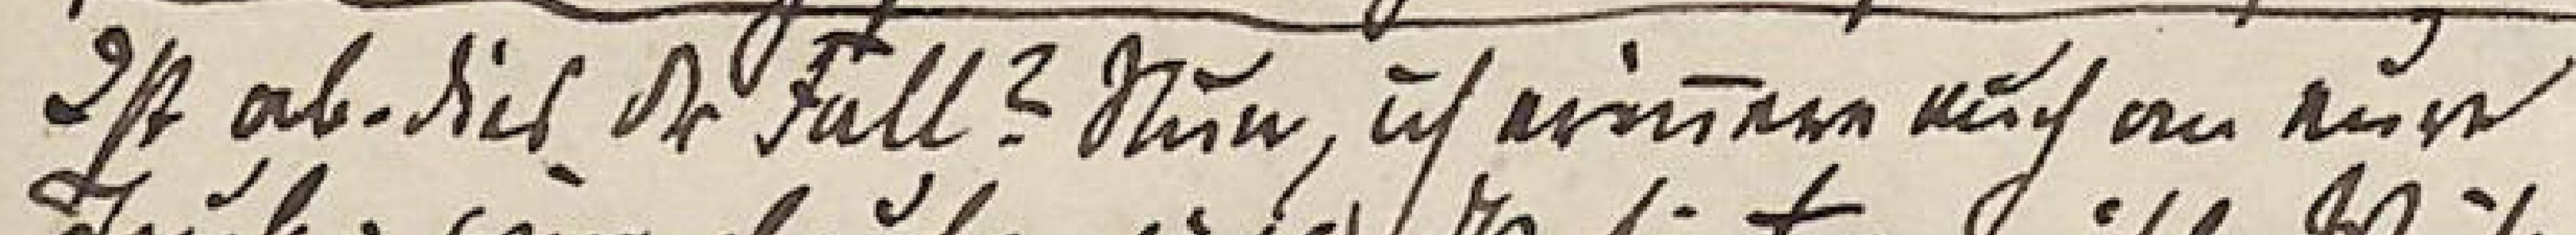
Ist ab. dies dr. Fall? Nun, ich erinere euch an eure
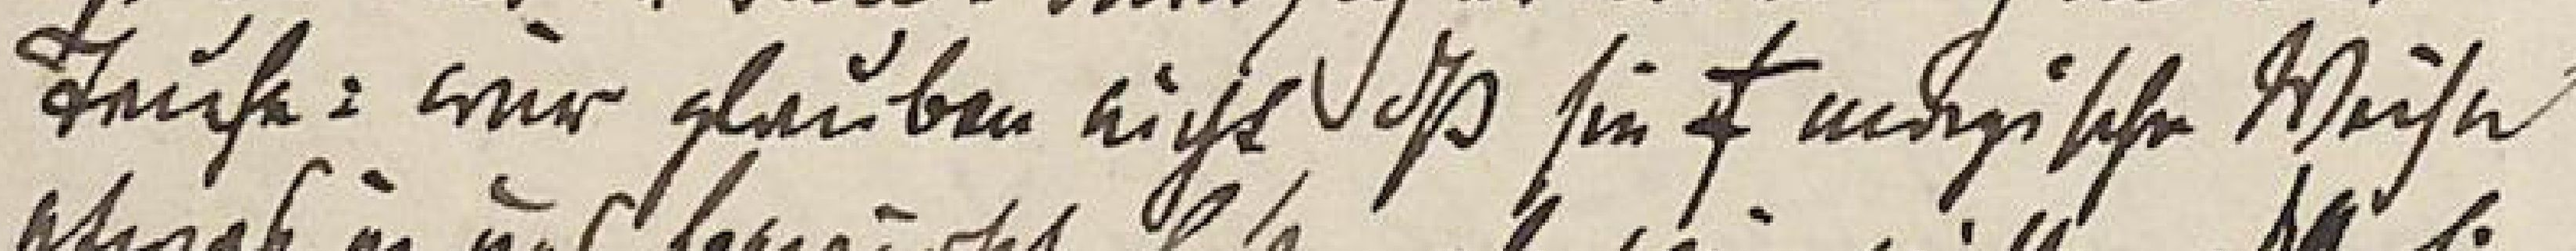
Taufe: wir glauben nicht, daß sie f magische Weise
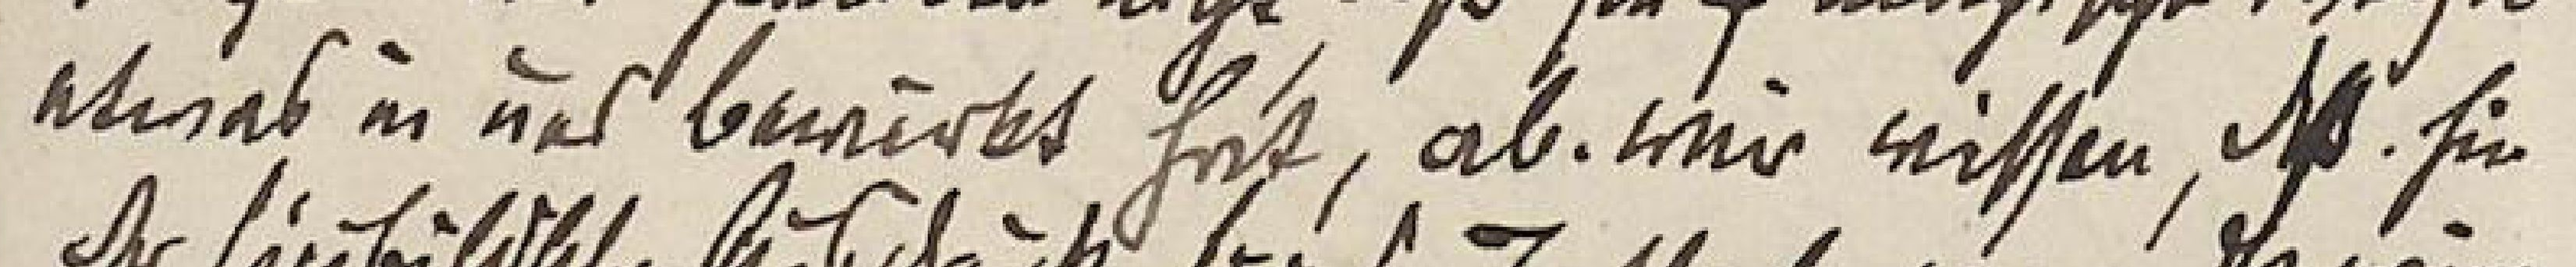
etwas in uns bewirkt hat, ab wir wissen, daß sie
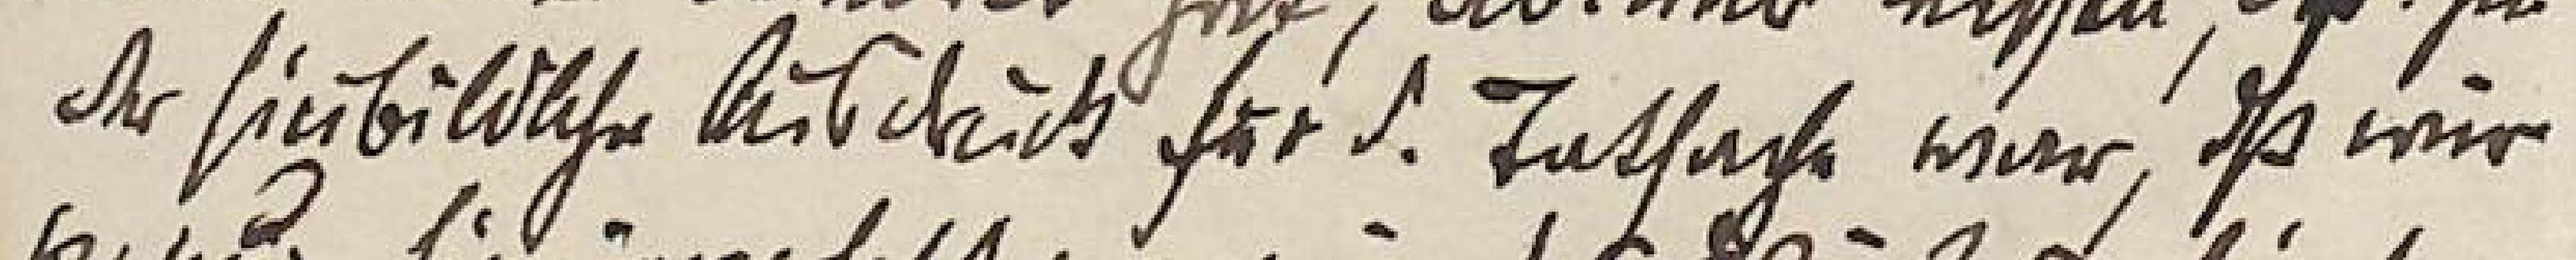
der sinbildliche Ausdruck für d. Tatsache war, daß wir
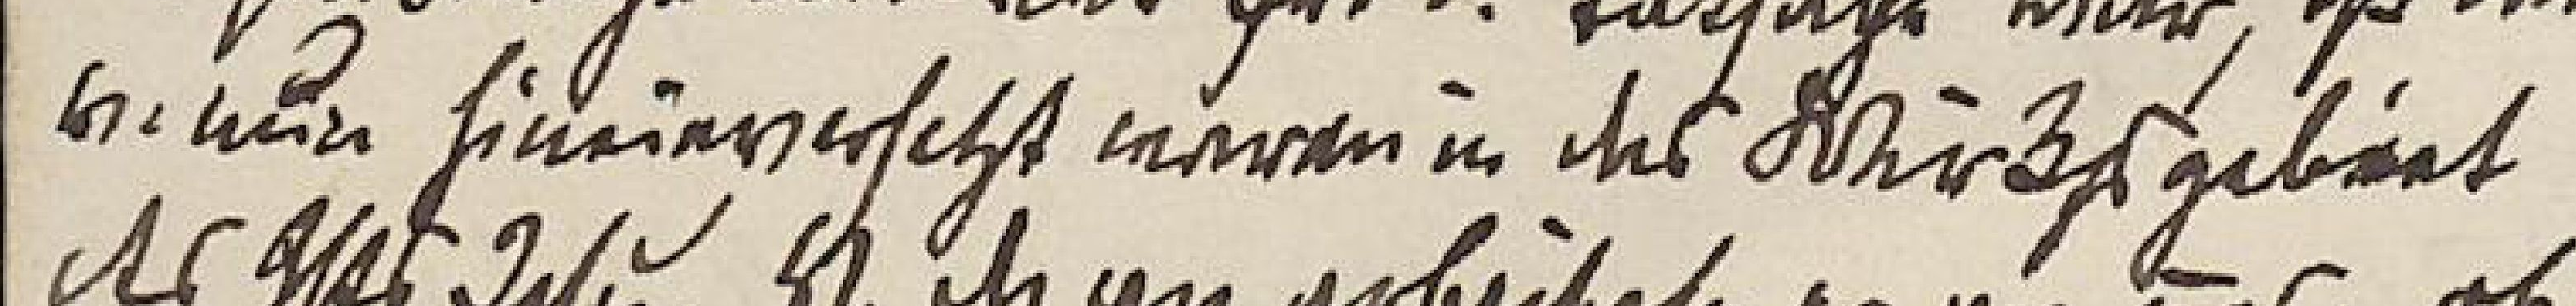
v. nun hineinversetzt waren in das Wirkgsgebiet
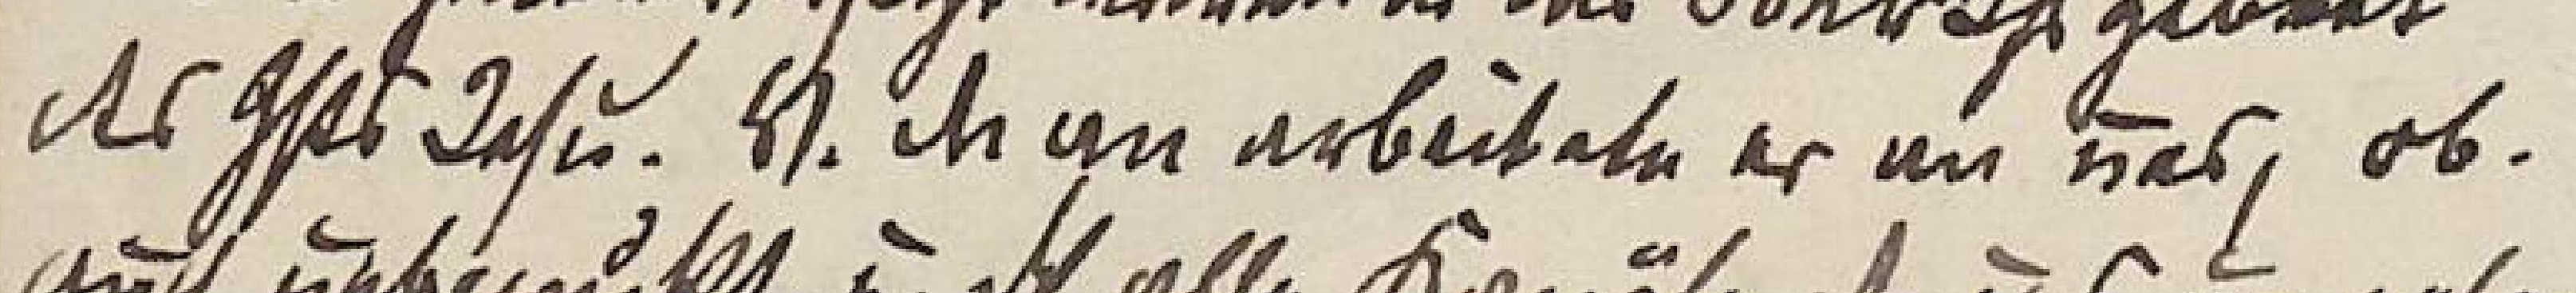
des Gsts Jesu. V. da an arbeitet er an uns, ob
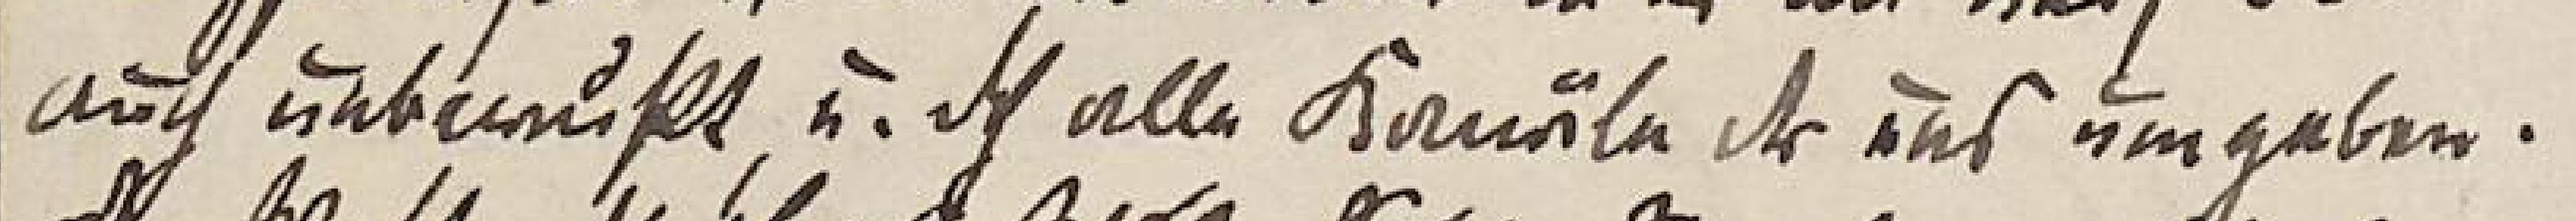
auch unbewußt, u. dch alle Kanäle dr uns umgeben¬
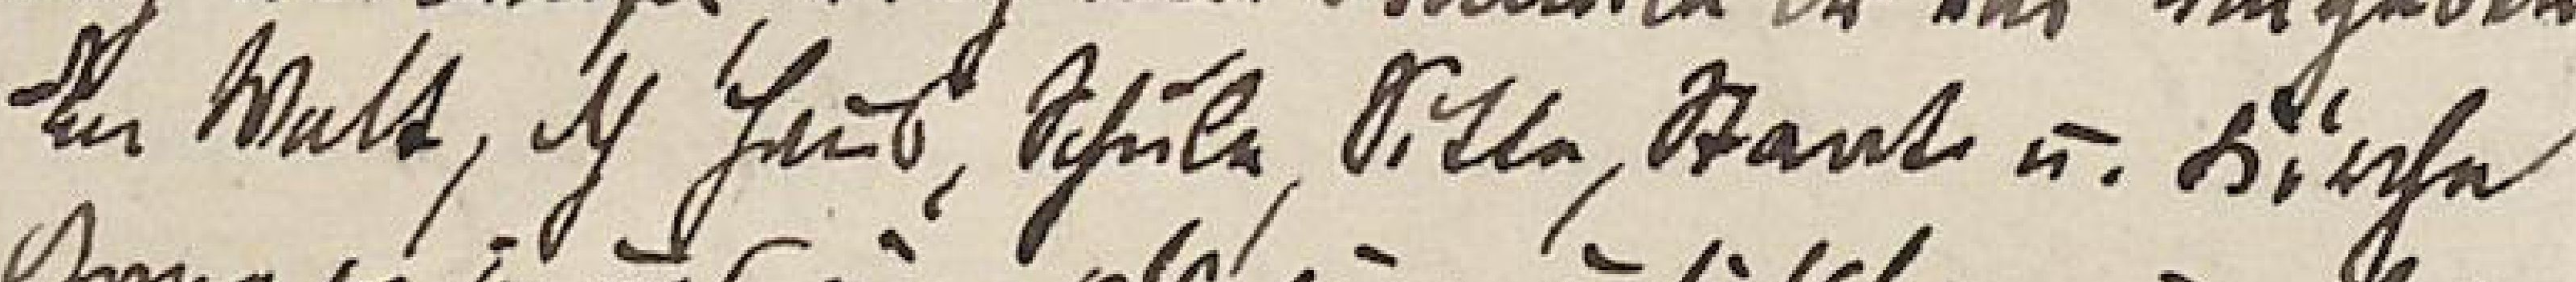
den Welt, dch Haus, Schule, Sitte, Staate u. Kirche
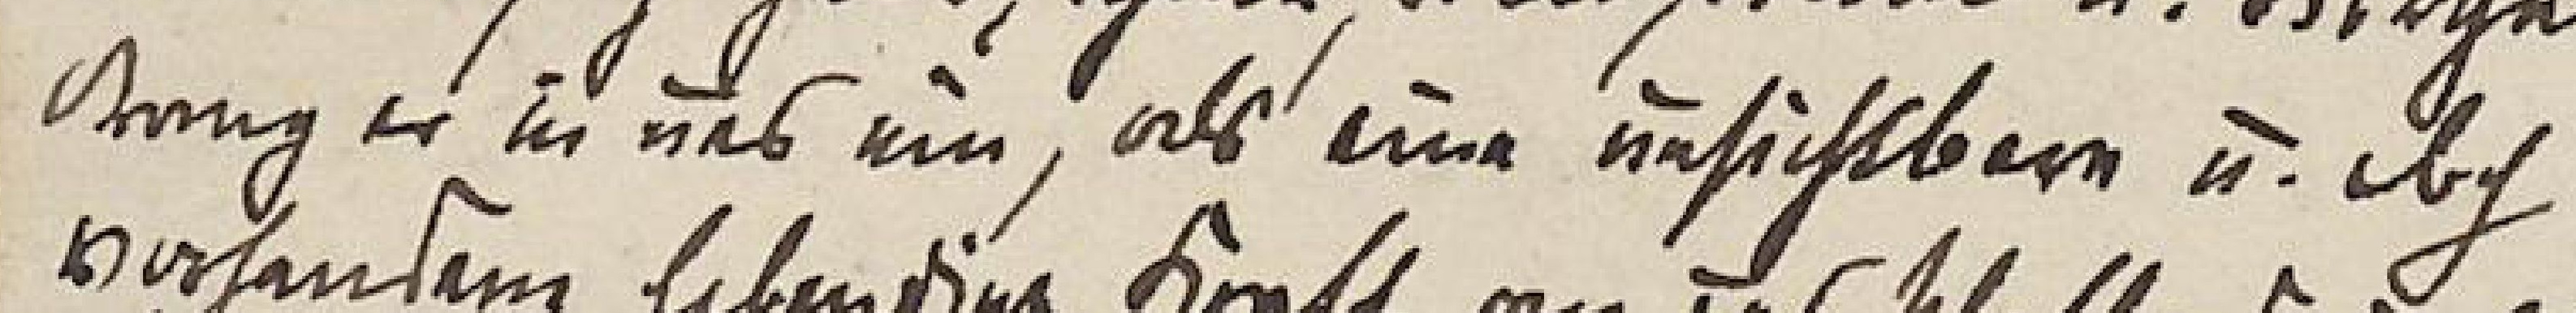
dran er in uns ein, als eine unsichtbare u. ebh.
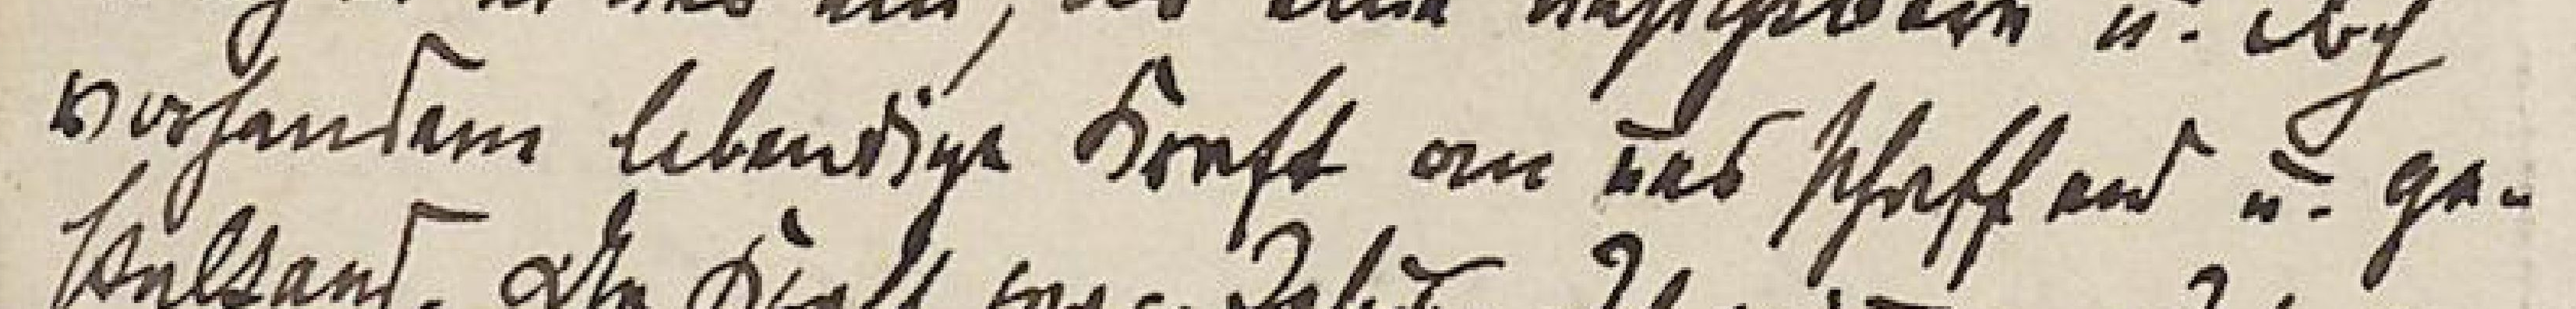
vorhandene lebendige Kraft an uns schaffend u. ge¬
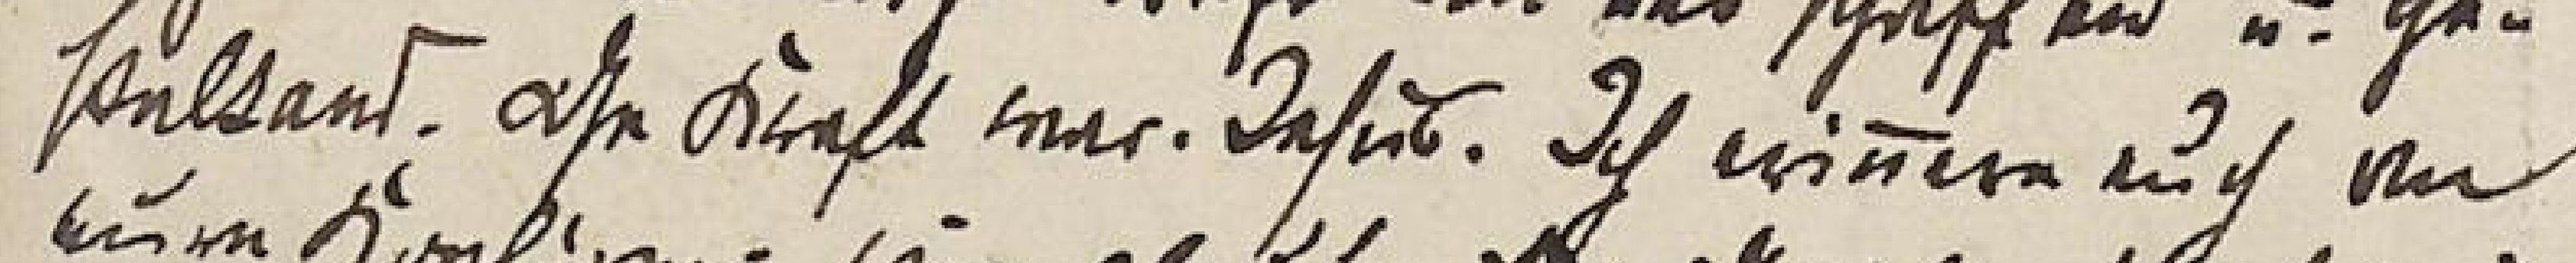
staltend. Dse Kraft war. Jesus. Ich erinere euch an
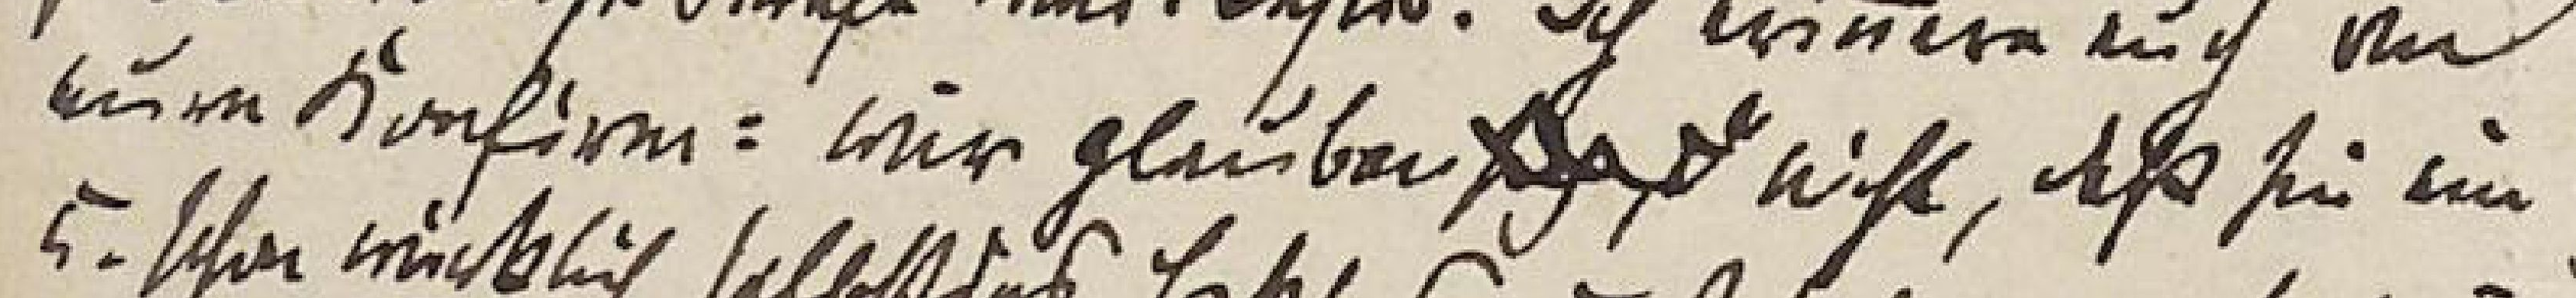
eure Konfirm: wir glauben sich, u. nicht, daß sie ein
